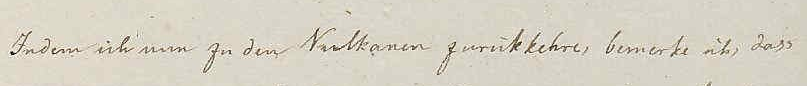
Indem ich nun zu den Vulkanen zurükkehre, bemerke ich, dass
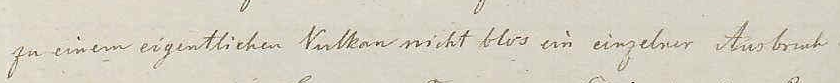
zu einem eigentlichen Vulkan nicht blos ein einzelner Ausbruch
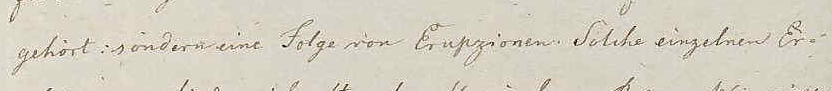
gehört: sondern eine Folge von Erupzionen. Solche einzelnen Er-
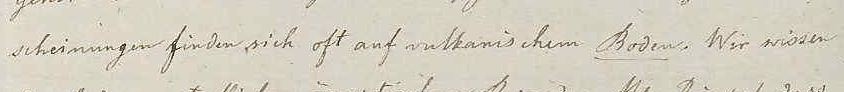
scheinungen finden sich oft auf vulkanischem Boden. Wir wissen
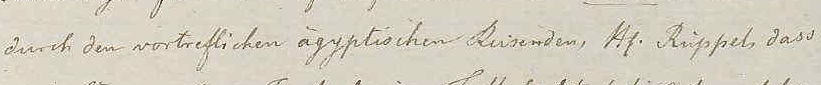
durch den vortreflichen ägyptischen Reisenden, H￼. Rüppel, dass
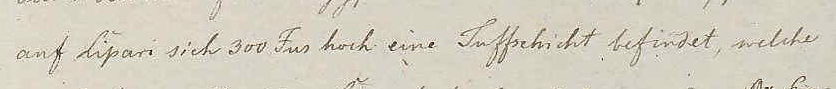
auf Lipari sich 300 Fus hoch eine Tuffschicht befindet, welche
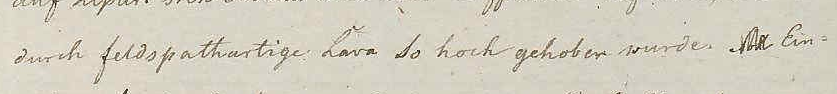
durch feldspathartige Lava so hoch gehoben wurde. Sol Ein-
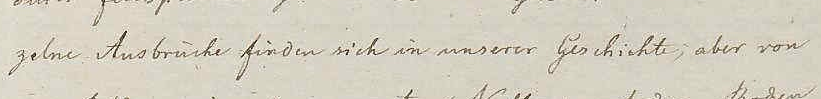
zelne Ausbrüche finden sich in unserer Geschichte, aber von
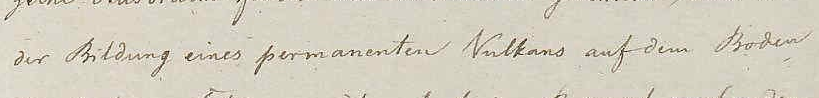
der Bildung eines permanenten Vulkans auf dem Boden
